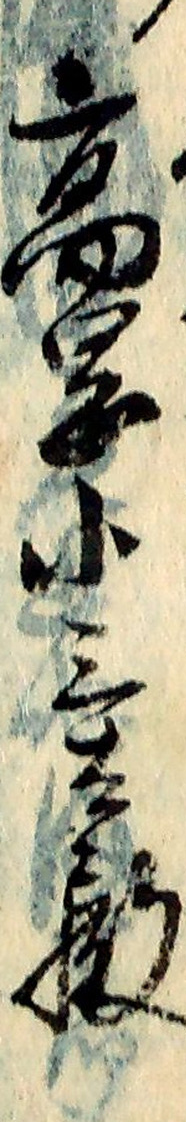高岡小三太殿
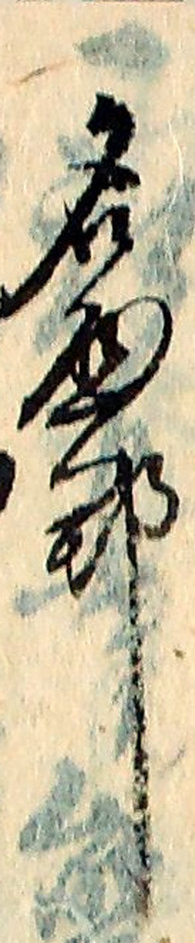名西郡
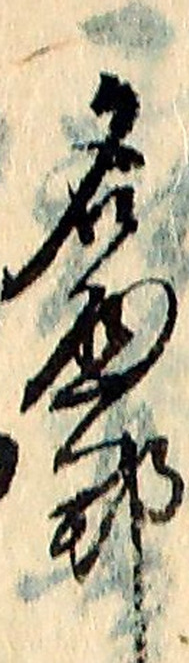名西郡
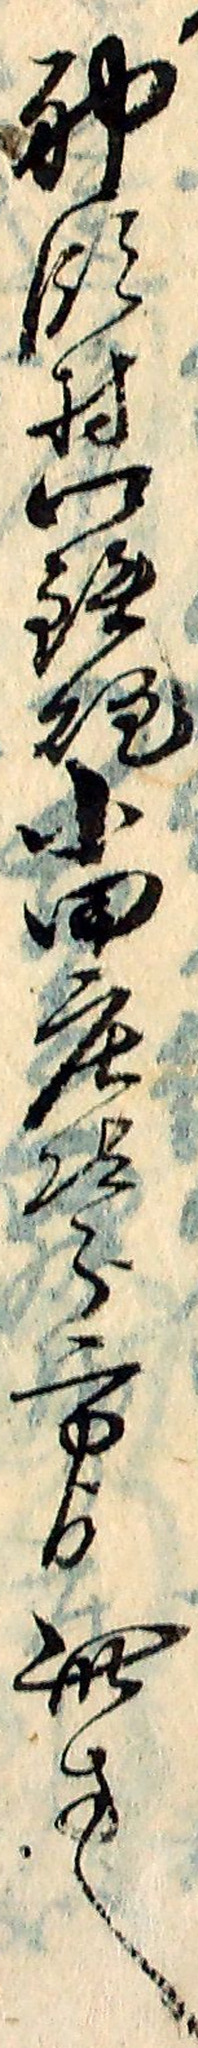神領村郷鉄砲小田庄次郎方ゟ此方へ
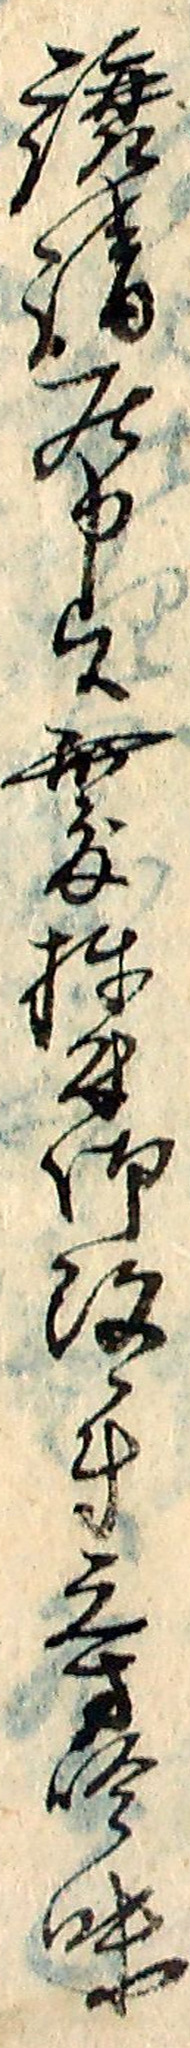譲請居申候此度株付御改に付元方吟味
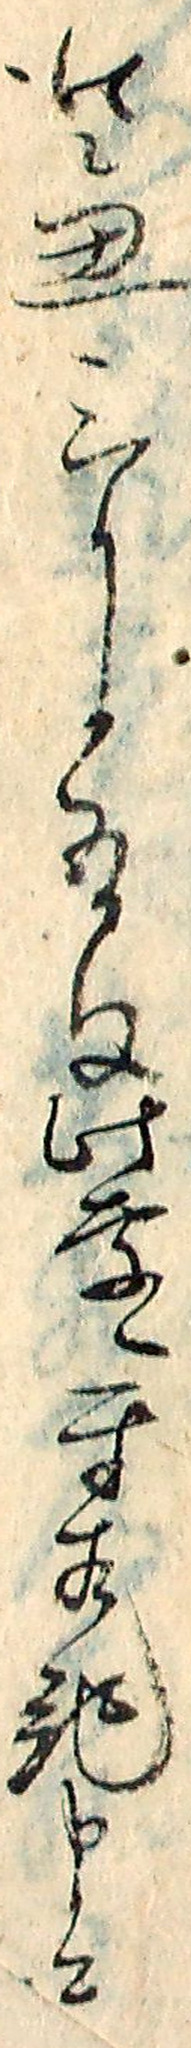仕り丑三月五日此処へ奉相記申候

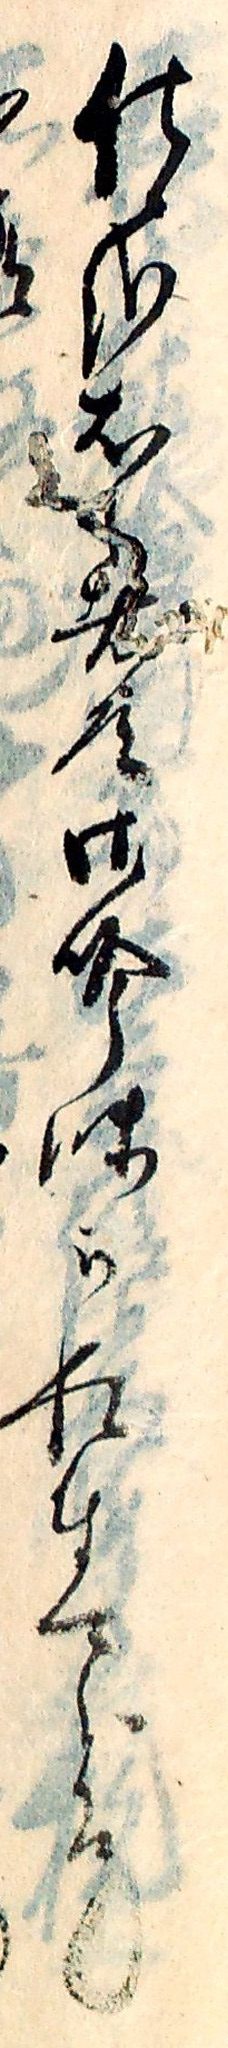仕候哉右之者共御吟味被仰付可被下候
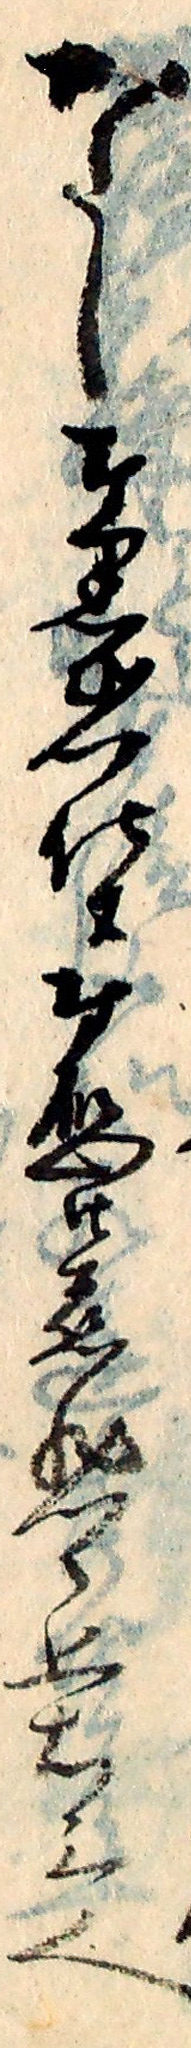かたく奉迷惑仕候奉恐御慈悲之上右三人
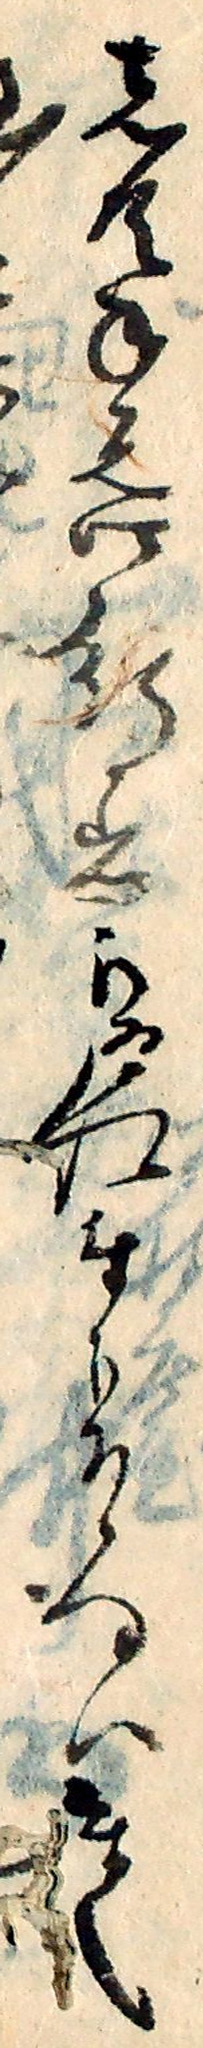者共手元御行着被為仰付被下候得は重々
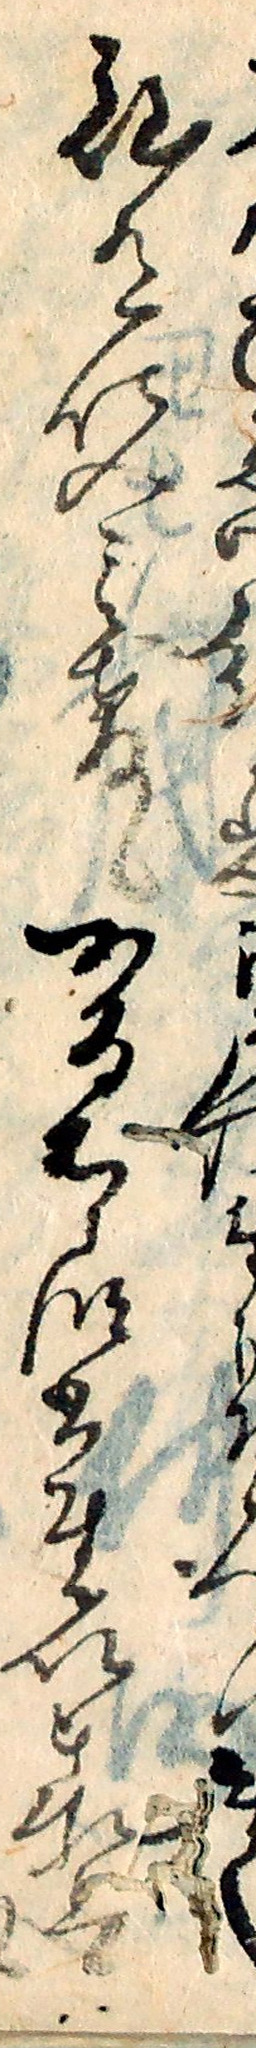難有仕合に奉存候仍て右之段書付を以奉願候以上
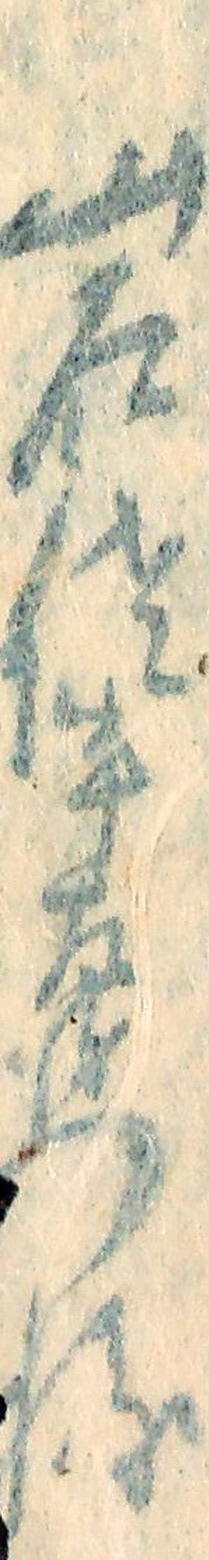岩佐半左衛門様
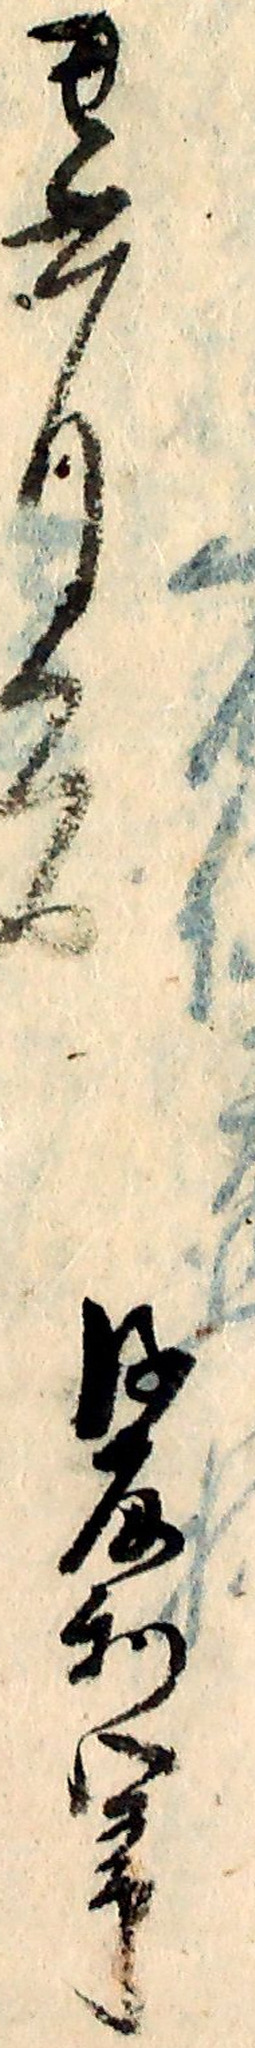丑六月二日後藤利八郎
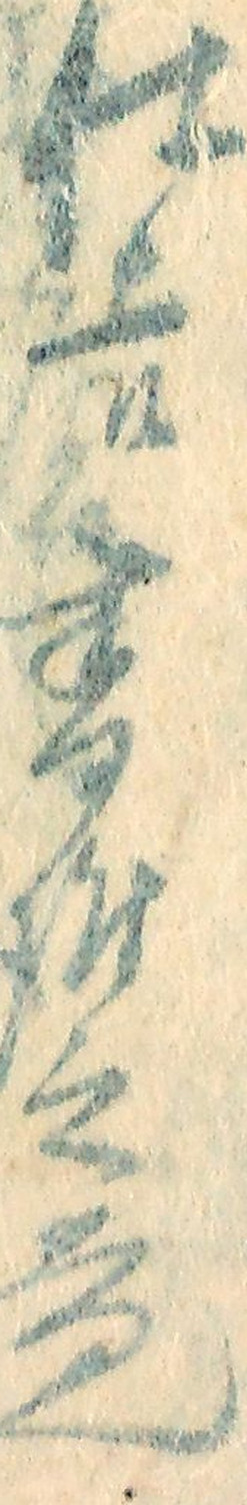仕上候書附之覚
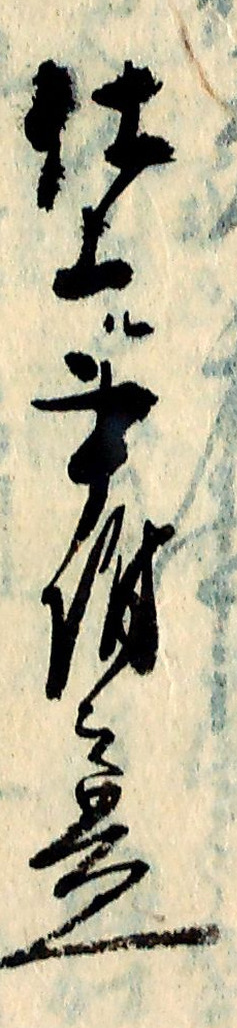仕上候書附之覚
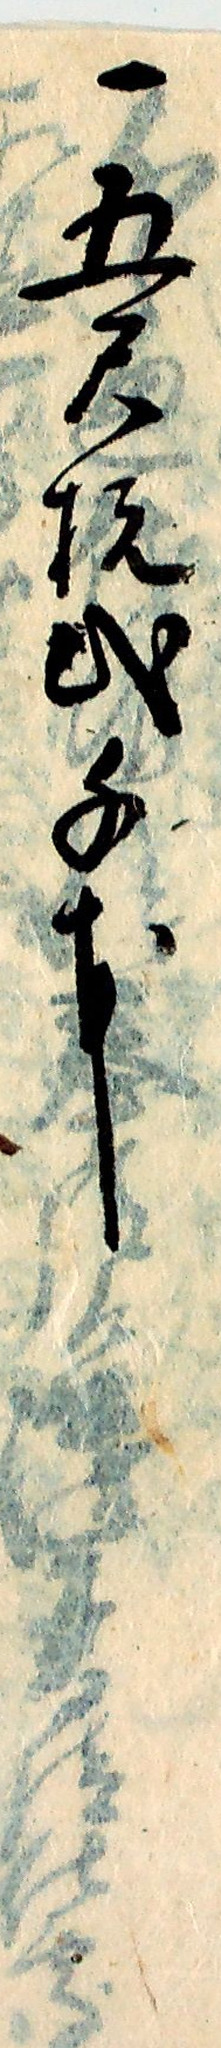一五尺杭弐千本
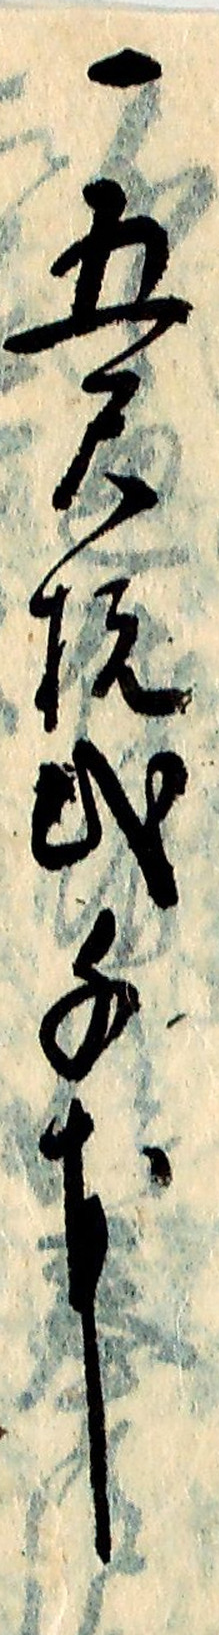一五尺杭弐千本
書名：諸御願書控(後藤氏壱番）
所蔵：鳴門教育大学 Naruto University of Education
